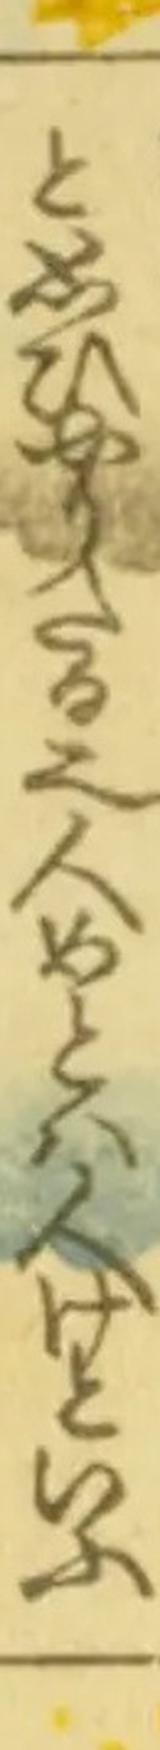と思ひやりたる也人めとは人けといふ
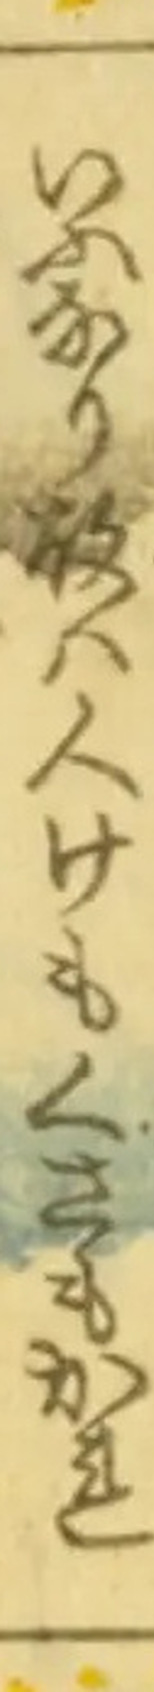いふなりせは人けもくさもかれ
